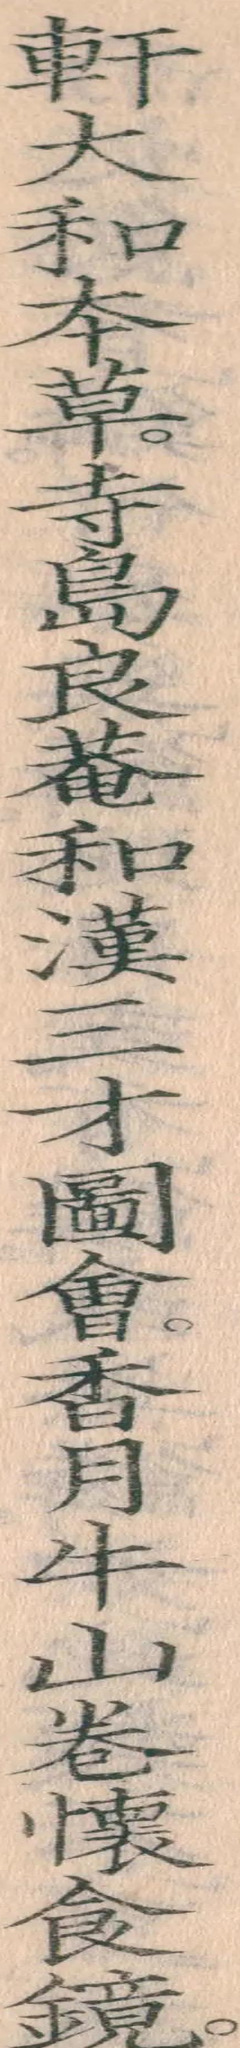軒大和本草。寺島良菴和漢三才図会。香月牛山巻懷食鏡。
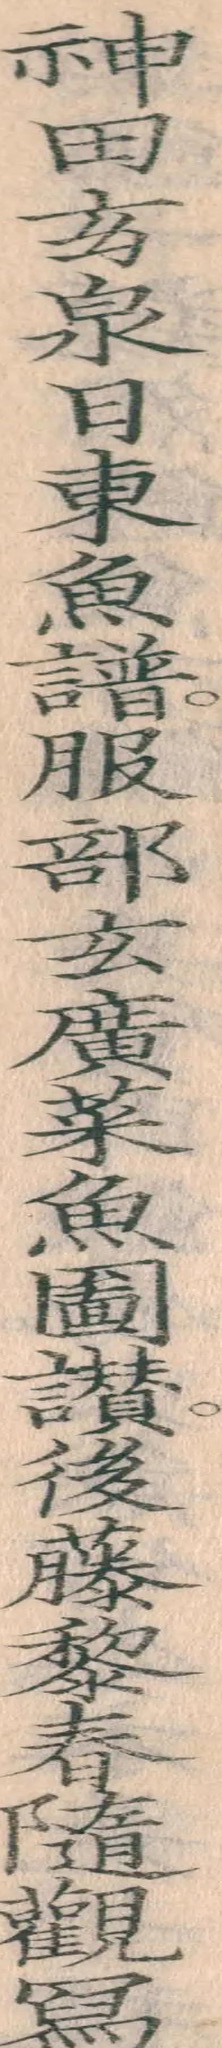神田玄泉日東魚譜。服部玄広菜魚図讃。後藤黎春随観写
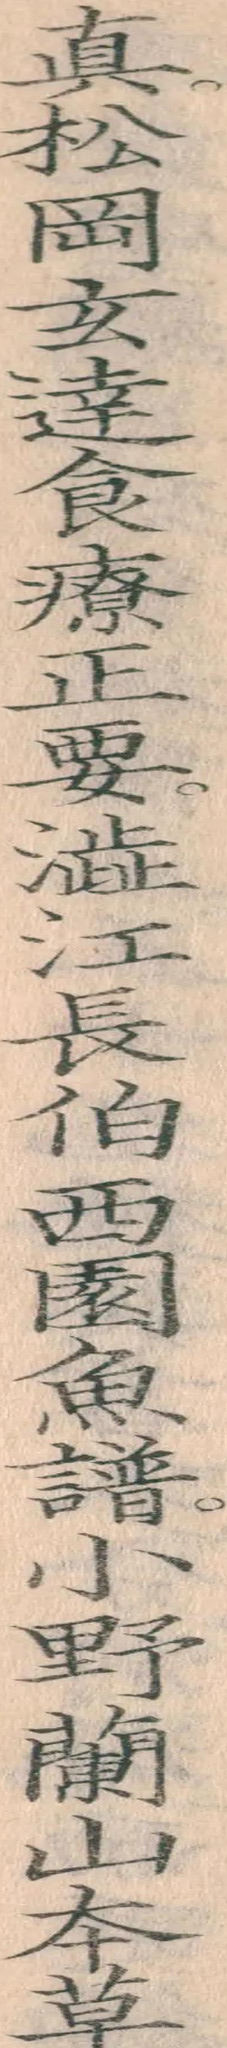真。松岡玄達食療正要。渋江長伯西園魚譜。小野蘭山本草
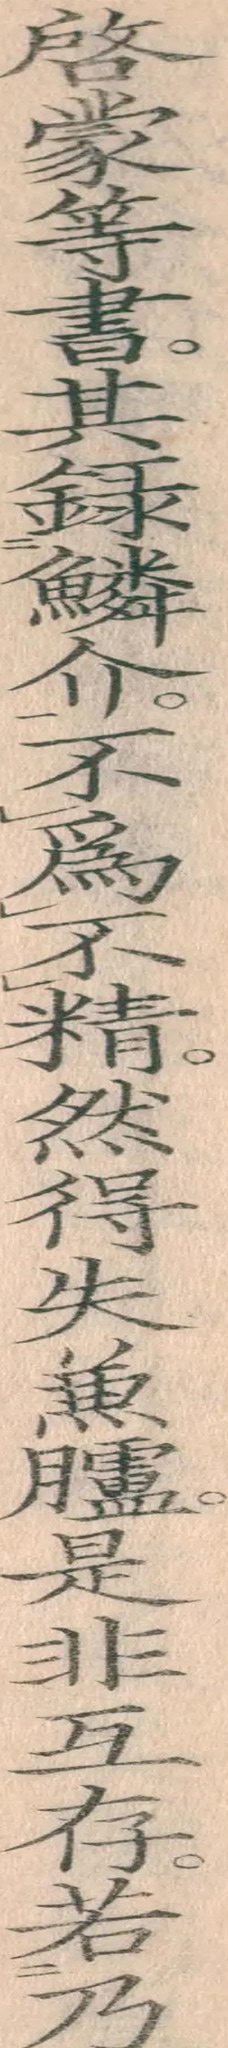啓蒙等書。其録鱗介。不為不精。然得失兼臚。是非互存。若乃
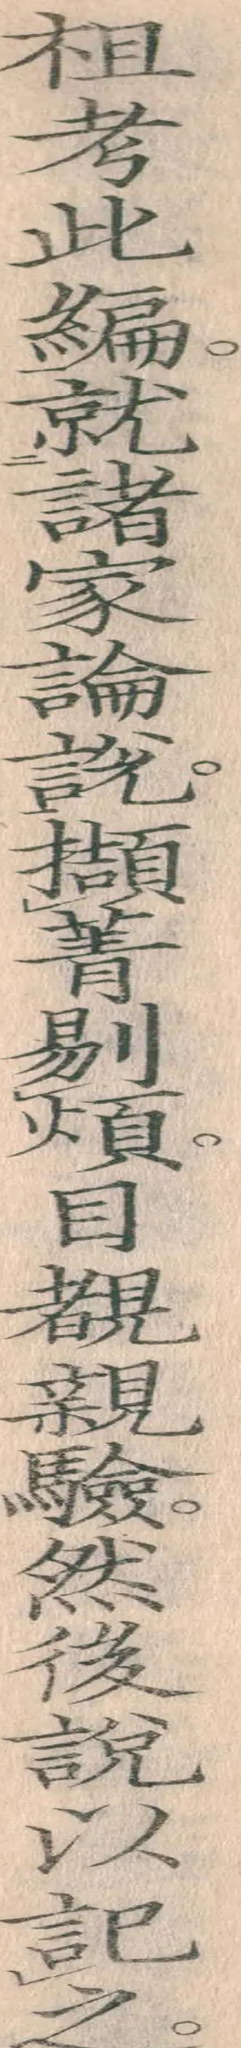祖考此編。就諸家論説。擷菁剔煩。目覩親験。然後説以記之。
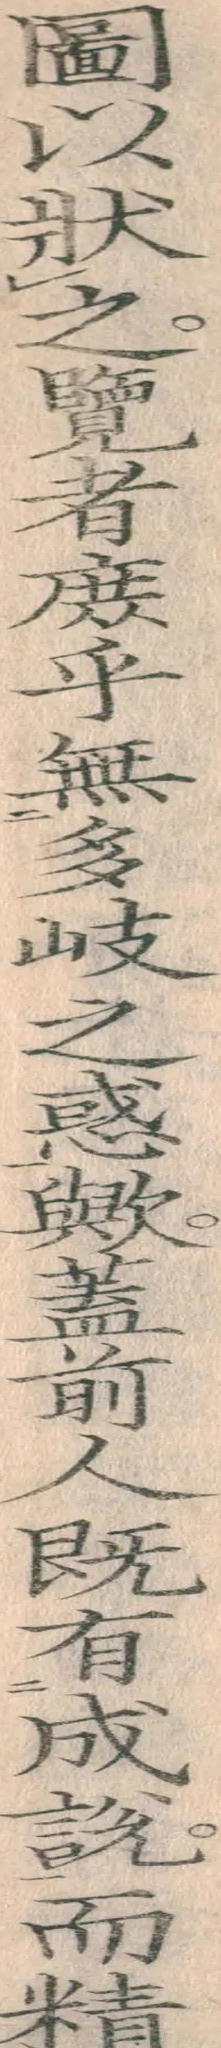図以状之。覧者庶乎無多岐之惑歟。蓋前人既有成説。而精
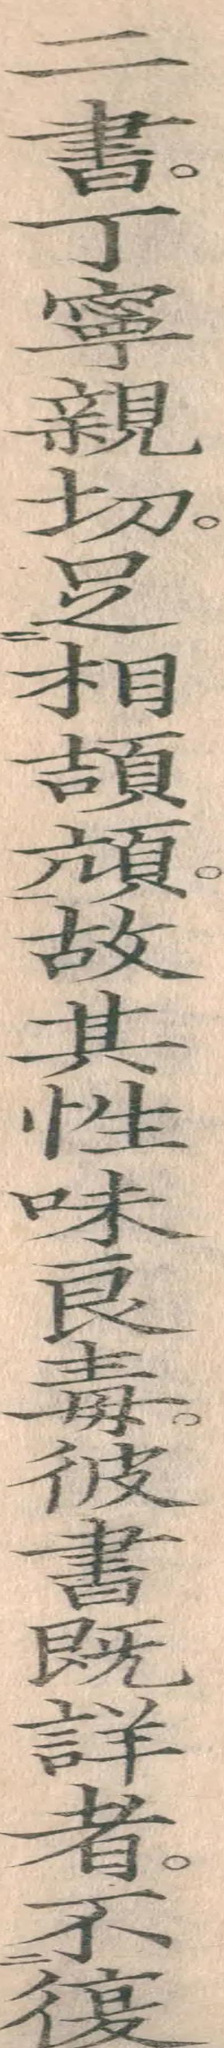二書。丁寧親切。足相頡頏。故其性味良毒。彼書既詳者。不復

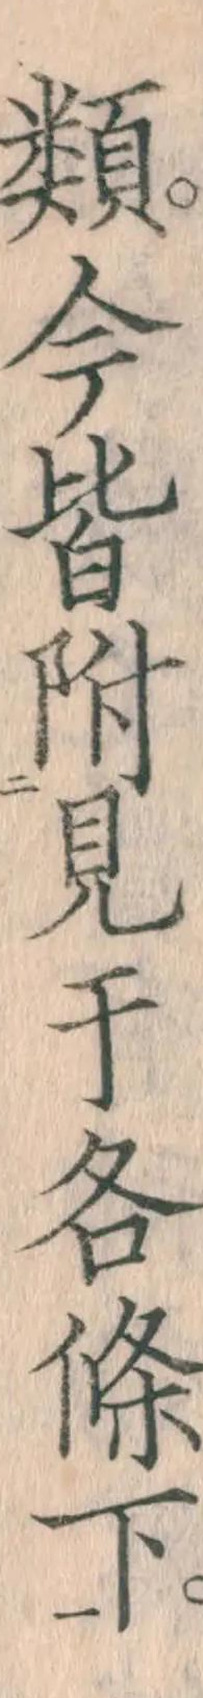類。今皆附見于各条下。
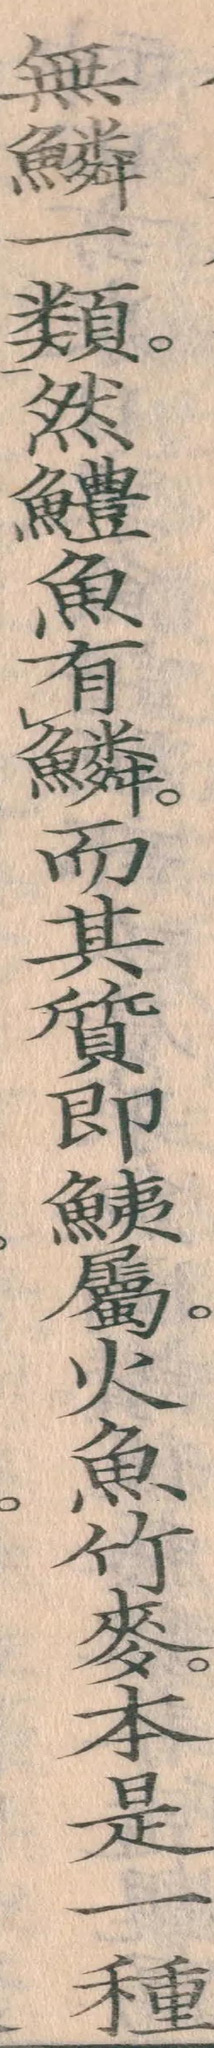無鱗一類。然鱧魚有鱗。而其質即鮧属。火魚竹麦。本是一種。
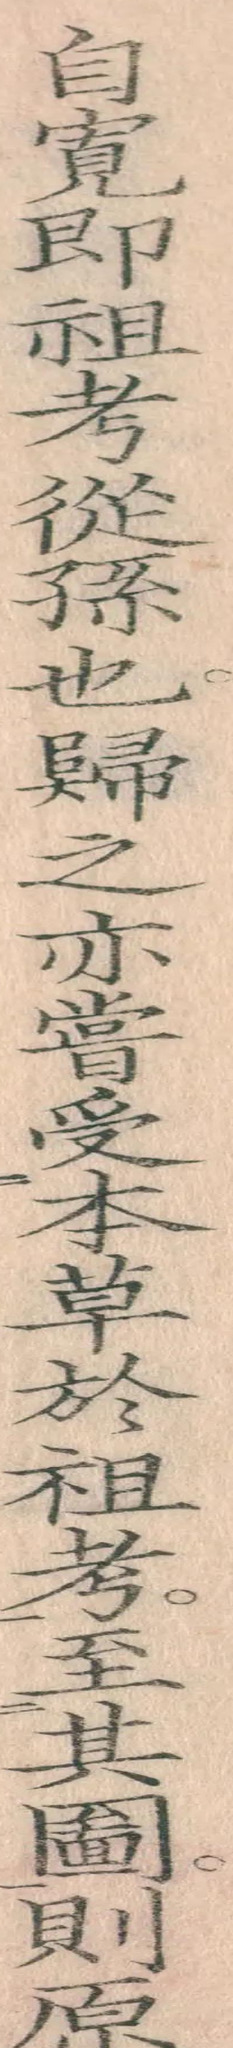自寛即祖考従孫也帰之亦嘗受本草於祖考。至其図。則原
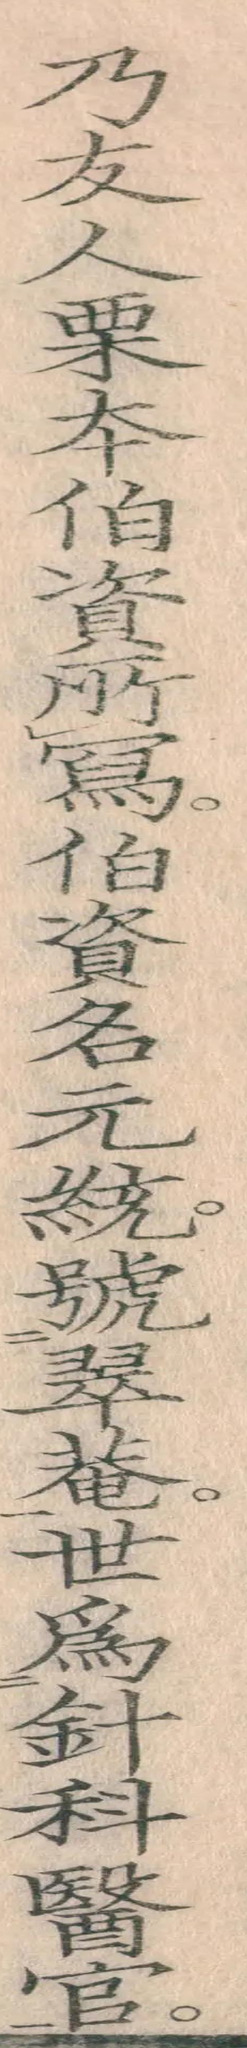乃友人栗本伯資所写。伯資名元統。号翠菴。世為針科医官。

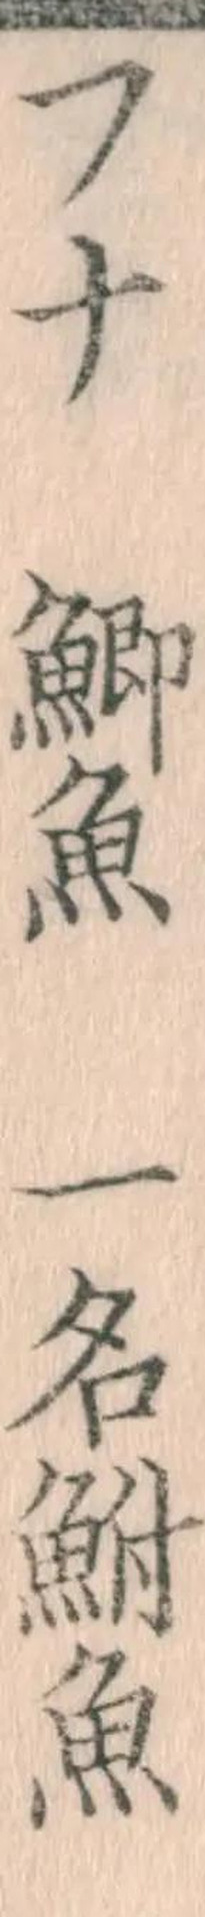フナ鯽魚一名鮒魚
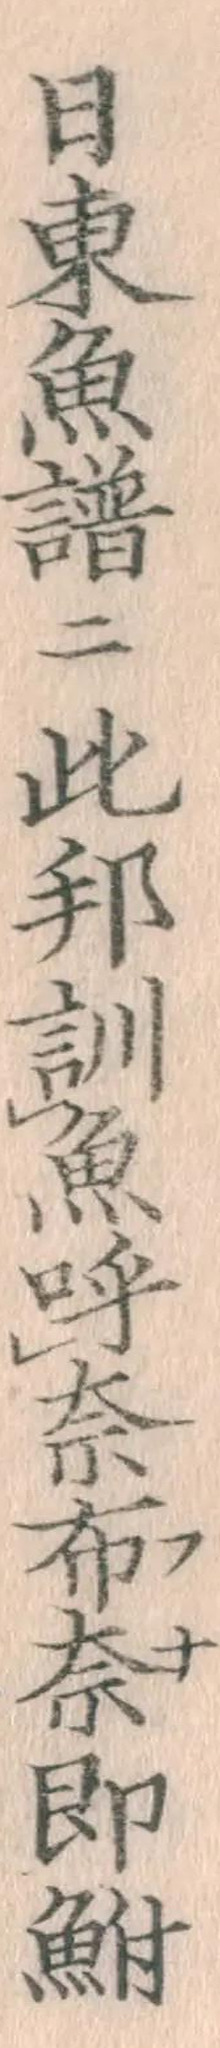日東魚譜ニ此邦訓魚呼奈布奈即鮒
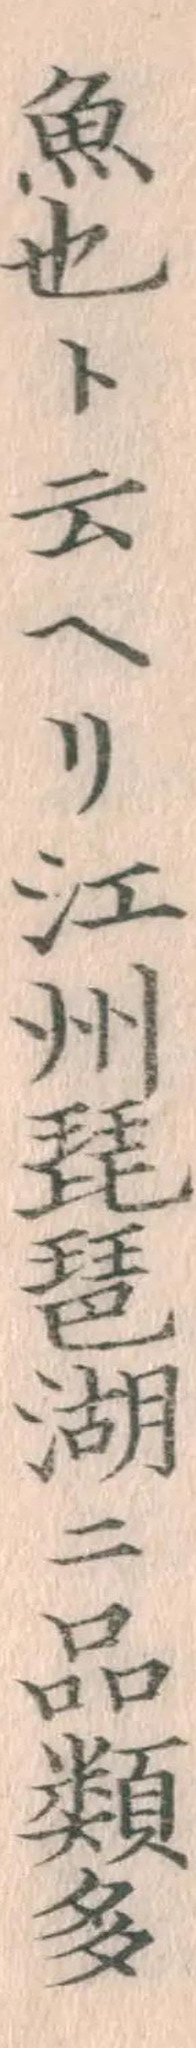魚也ト云ヘリ江州琵琶湖ニ品類多
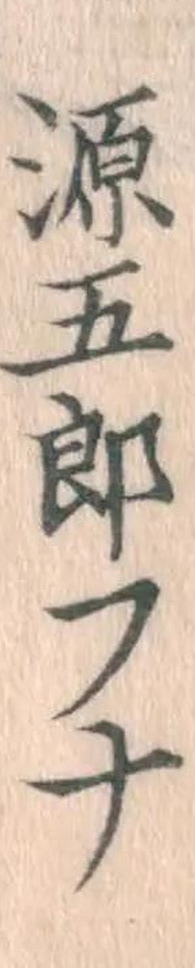源五郎フナ
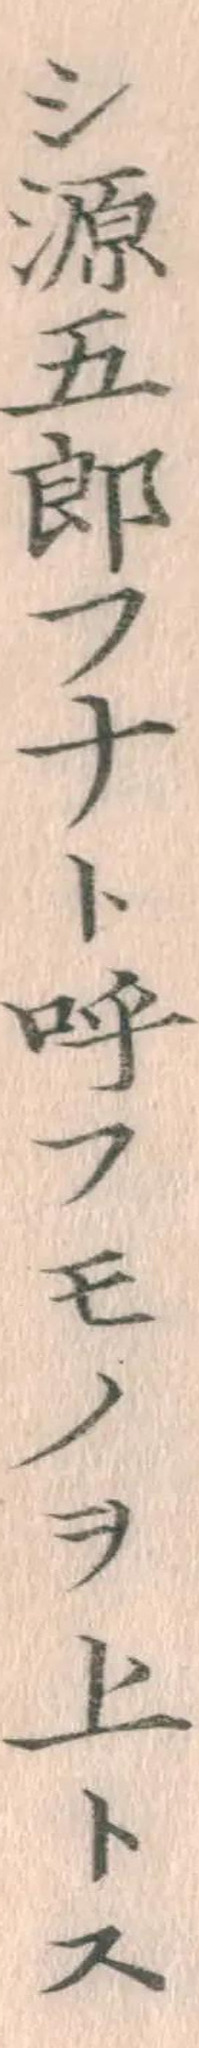シ源五郎フナト呼フモノヲ上トス
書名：皇和魚譜 2巻
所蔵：国立国会図書館 National Diet Library, JAPAN
